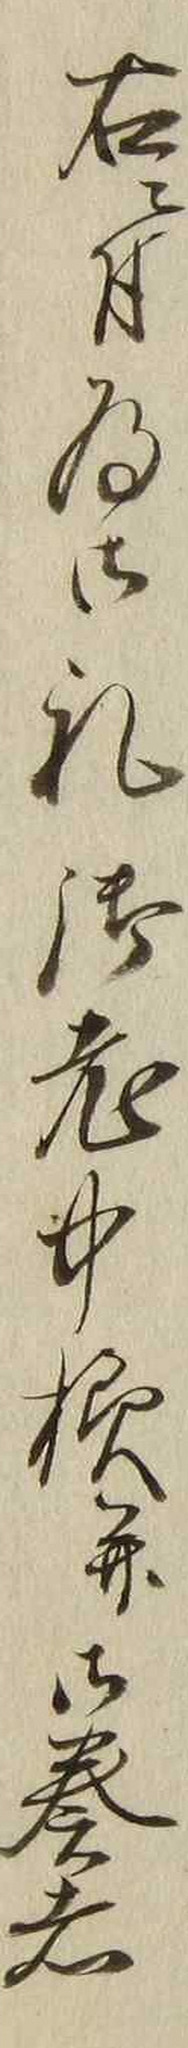右に付為御礼御老中様并御奏者
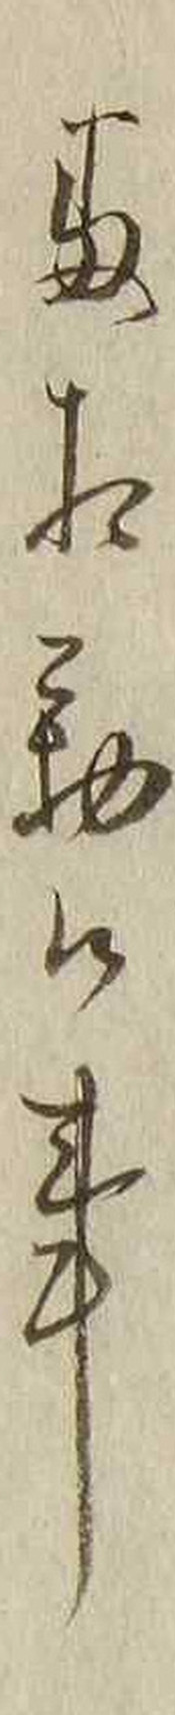番相勤候事
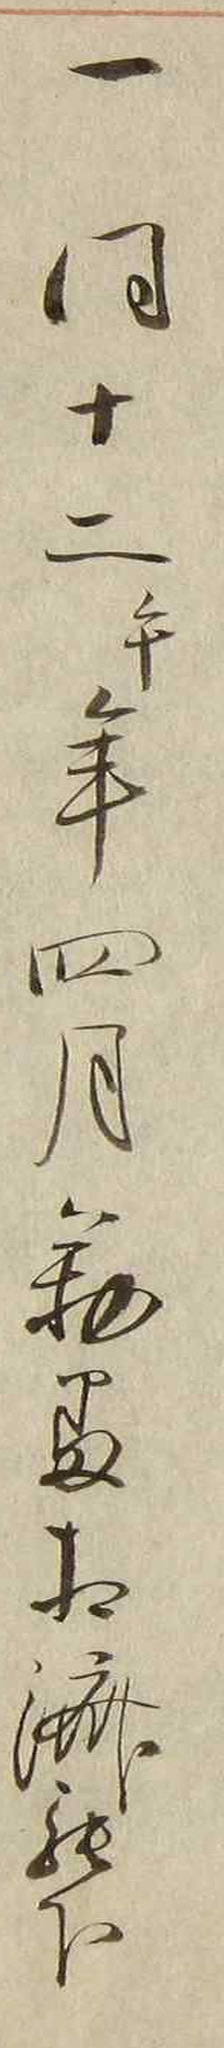一同十二午年四月勤番相済罷下
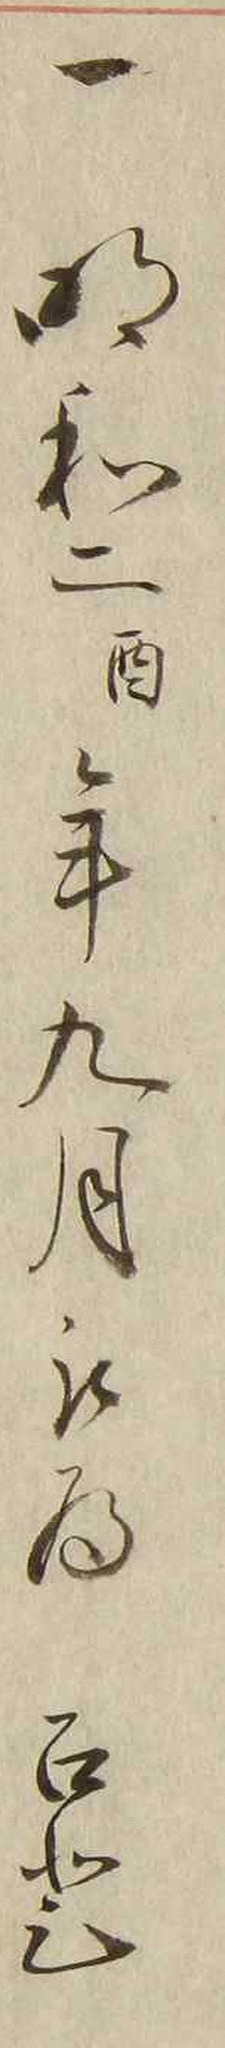一明和二酉年九月被為召登

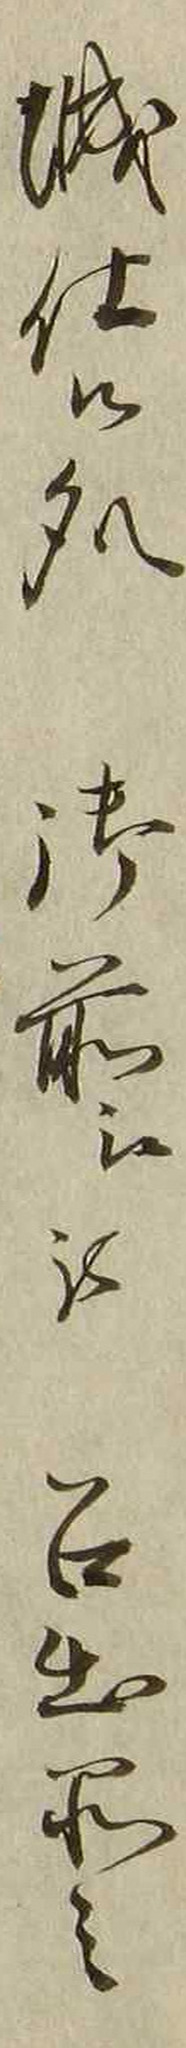城仕候処御前江被召出品之
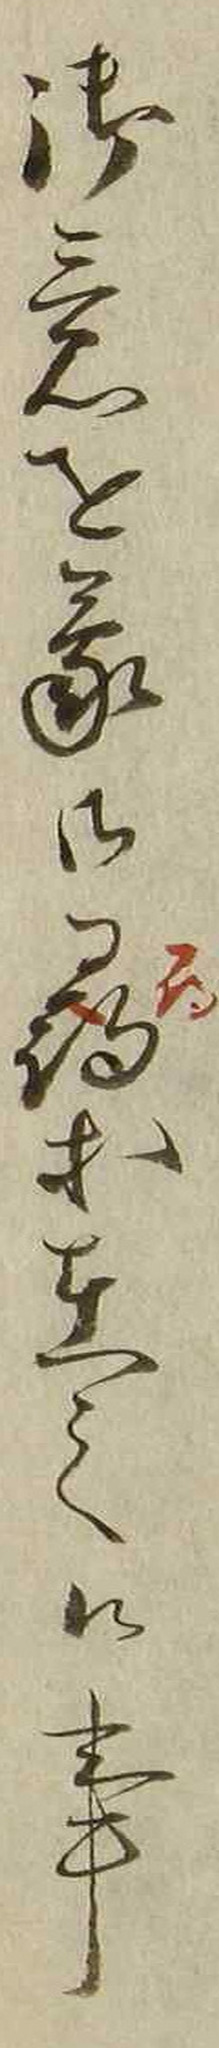御意を蒙御尋尋等在之候事
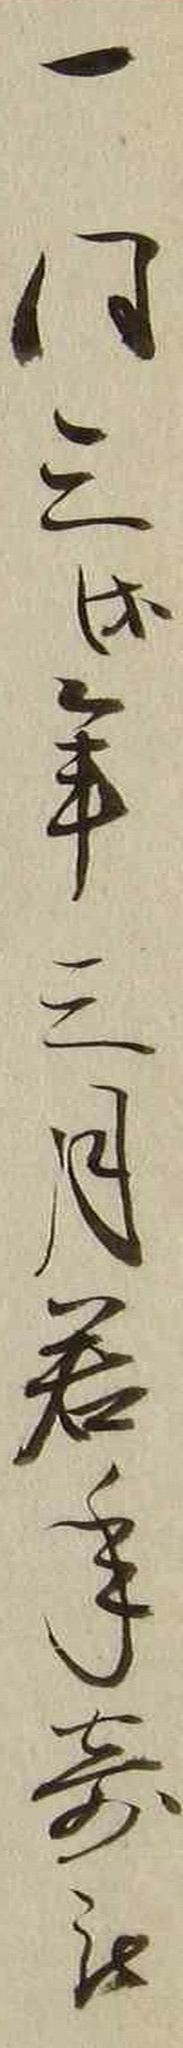一同三戌年三月若年寄被
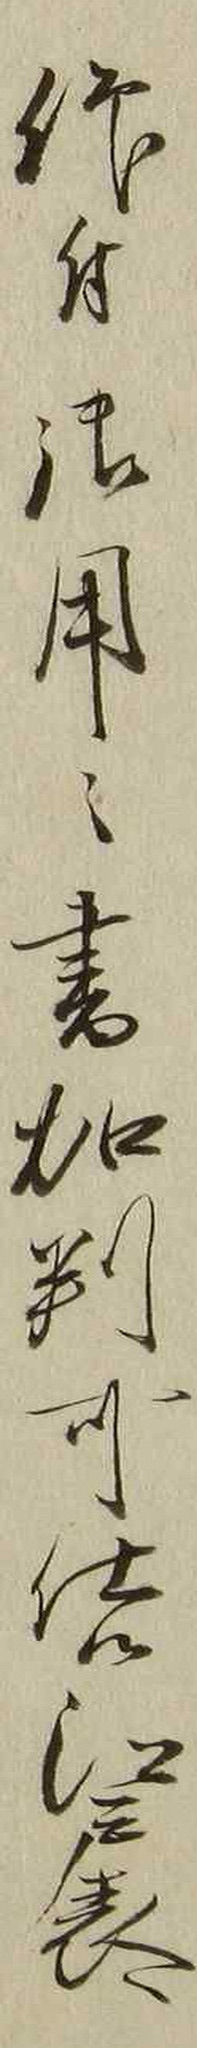仰付御用之書加判可仕候江戸表へ
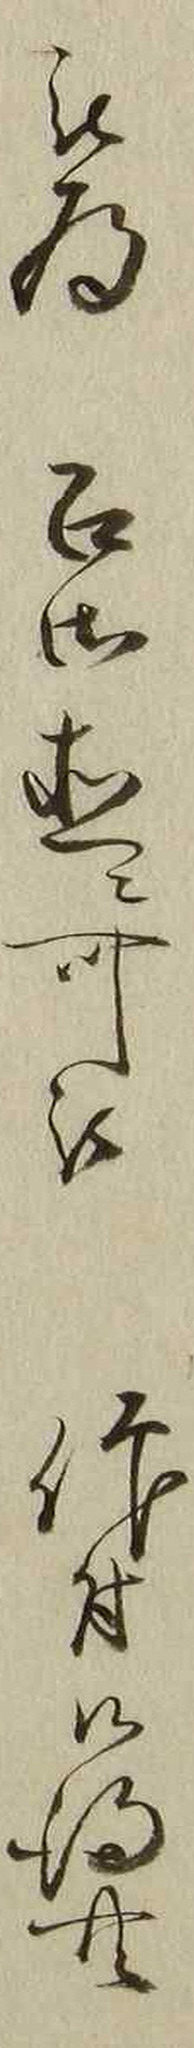被為召御直に可被仰付候得共
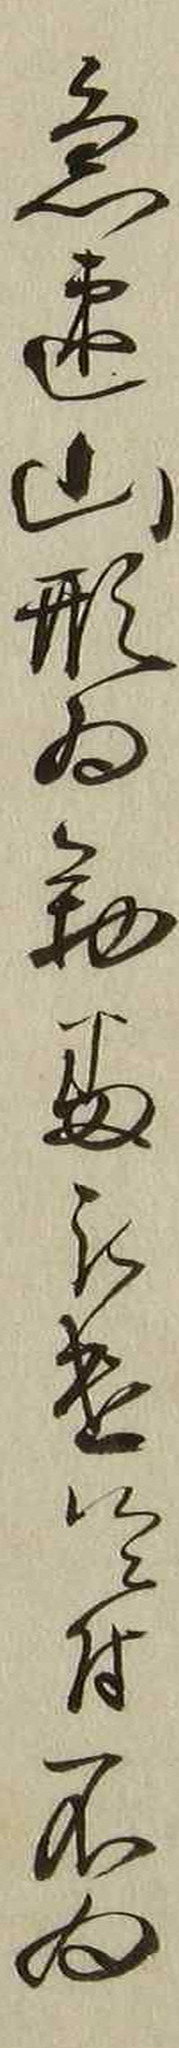急速山形為勤番被遣候に付不為
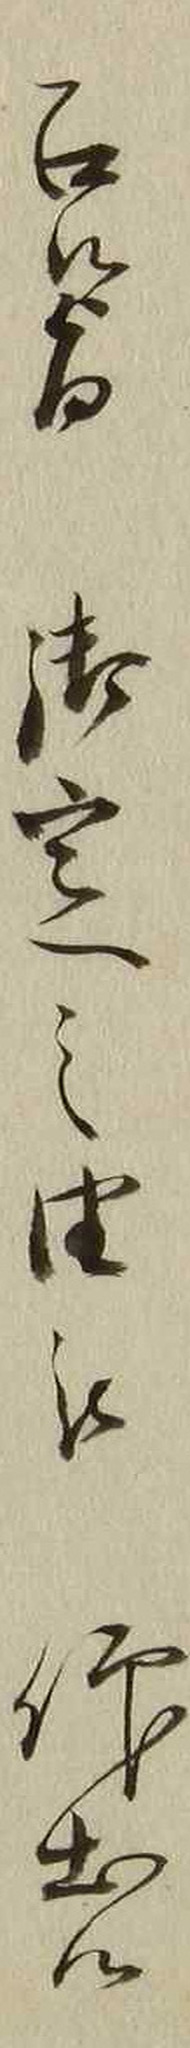召候旨御定之由被仰出候
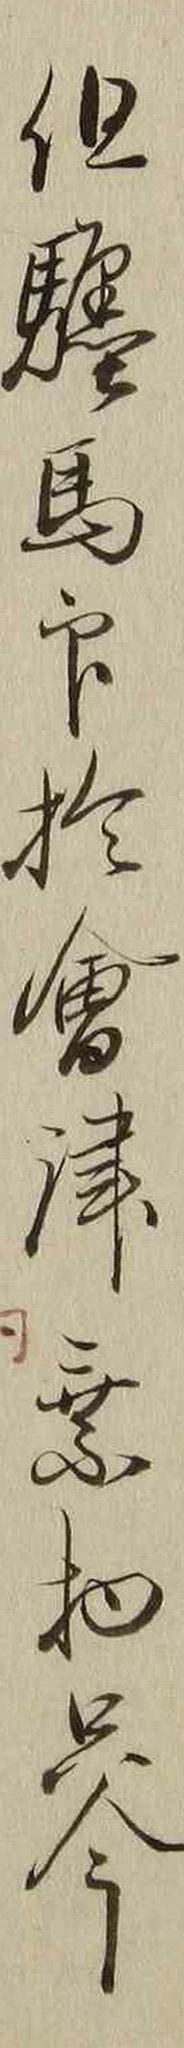但馬印於会津乗物只今
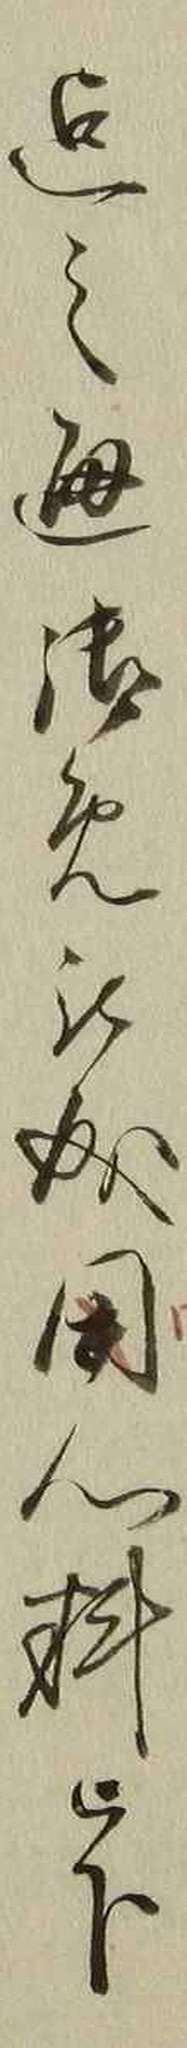迄之通御免被成同心料被下
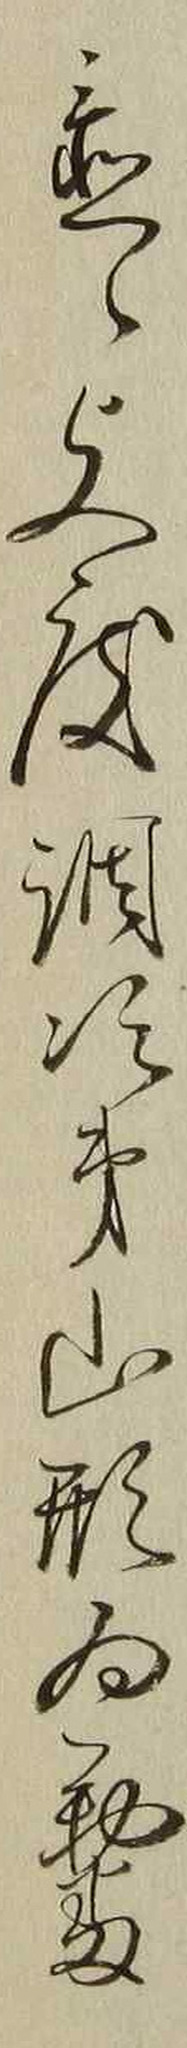置候支度調次第山形為勤番
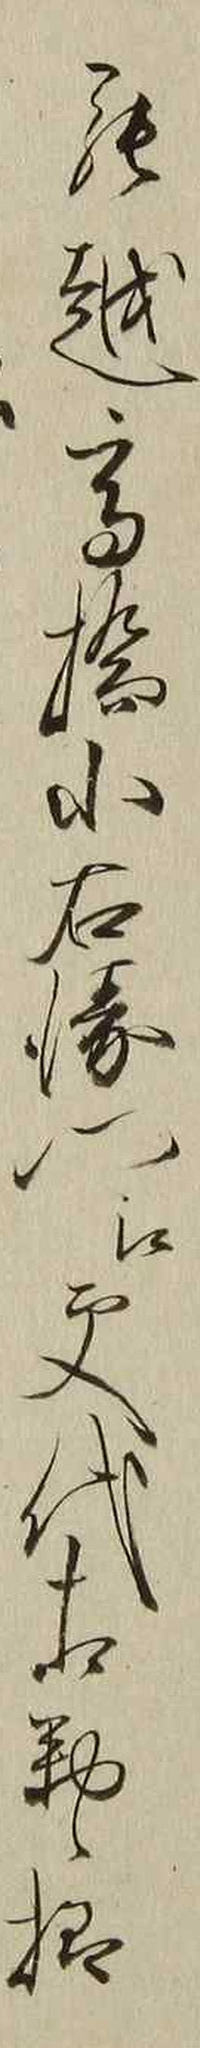罷越高橋小右衛門へ更代相勤候様
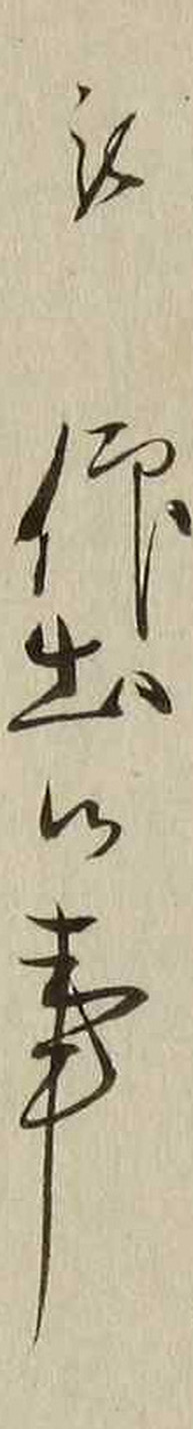被仰出候事
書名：諸士系譜　巻之103　か之部11
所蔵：会津若松市立会津図書館
